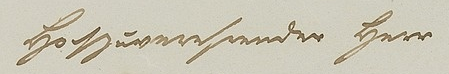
Hochzuverehrender Herr
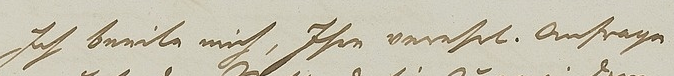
Ich beeile mich, Ihre verehrl. Anfrage
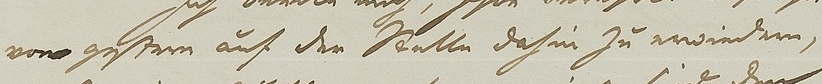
von gestern auf der Stelle dahin zu erwiedern,
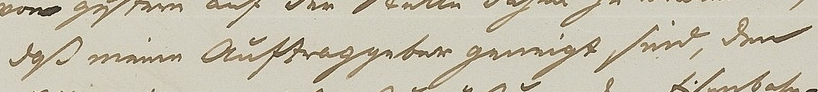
daß meine Auftraggeber geneigt sind, den
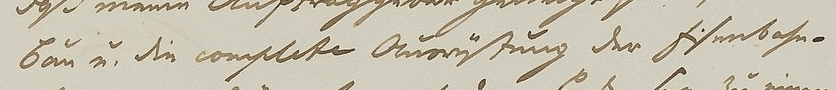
Bau u. die complete Ausrüstung der Eisenbahn--
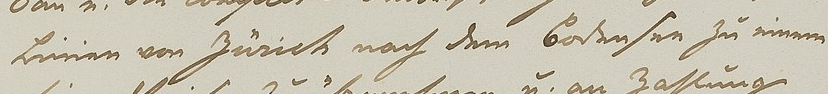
Linien von Zürich nach dem Bodensee zu einem
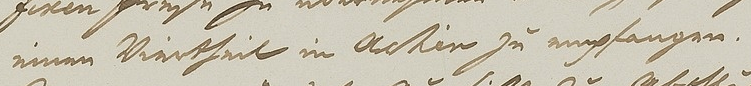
einen Viertheil in Actien zu empfangen.
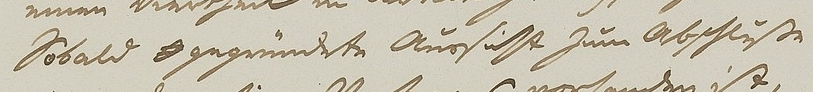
Sobald gegründete Aussicht zum Abschluße
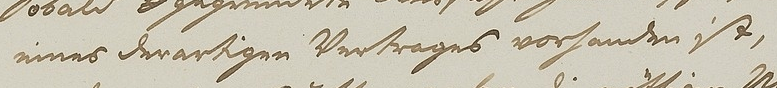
eines derartigen Vertrages vorhanden ist,
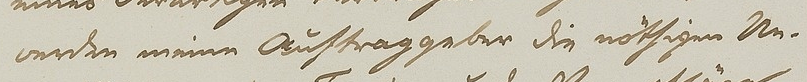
werden meine Auftraggeber die nöthigen Un-
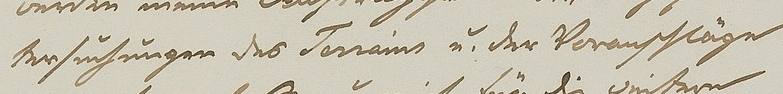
tersuchungen des Terrains u. der Voranschläge
